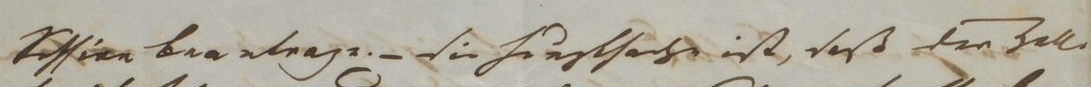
Session beantrage. – Die Hauptsache ist, daß der Zoll-
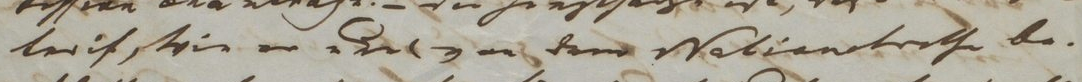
tarif, wie er nun von dem Nationalrathe be-
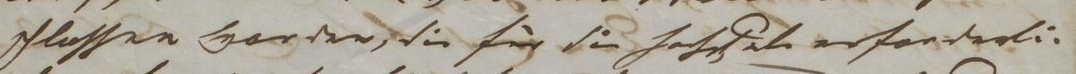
schlossen worden, die für die Hochschule erforderli-
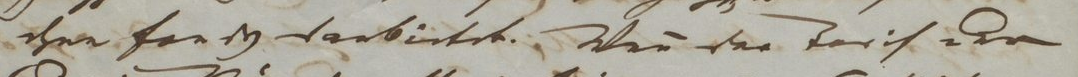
chen Fonds darbietet. Wenn der Tarif nur
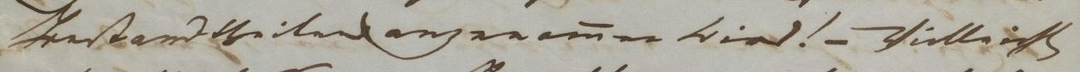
Bestandtheilen angenommen wird! – Vielleicht
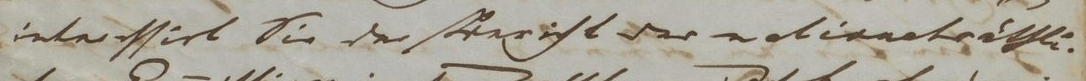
interessirt Sie der Bericht der nationalräthli-
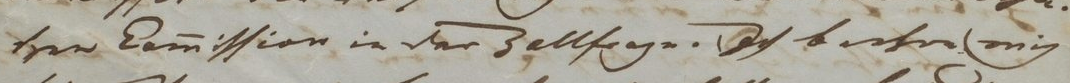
chen Commission in der Zollfrage. Ich beehre mich
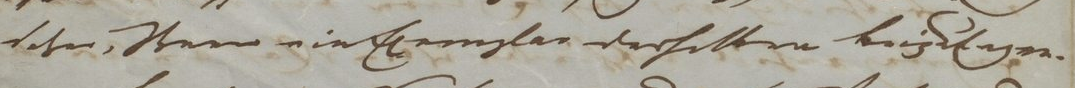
daher, Ihnen ein Exemplar desselben beizulegen.
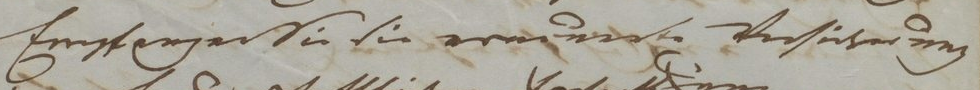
Empfangen Sie die erneuerte Versicherung
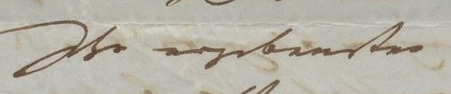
Ihr ergebenster
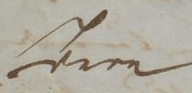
Escher
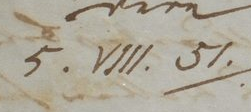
5. VIII. 51
